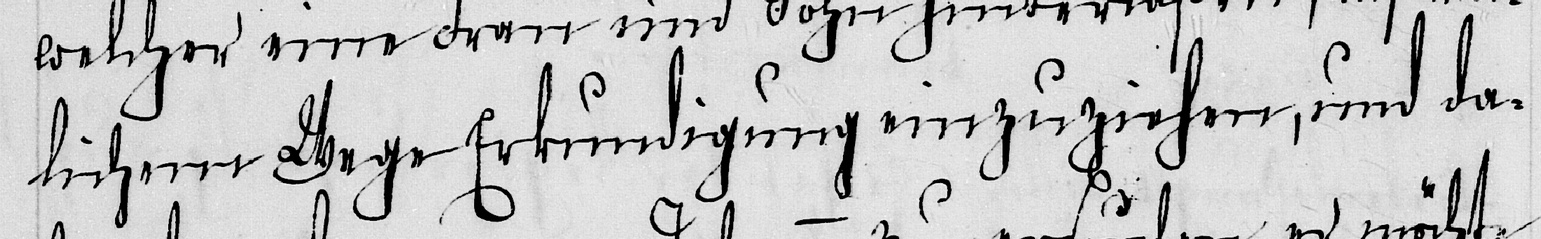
lichem Wege Erkundigung einzuziehen, und da¬
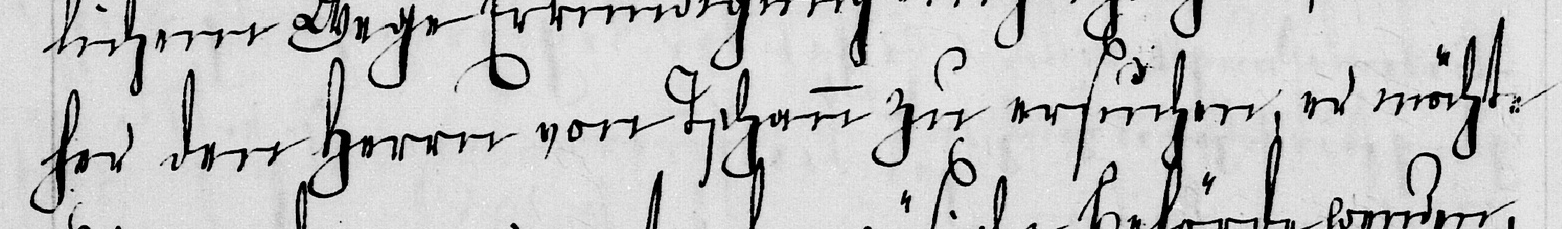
her den Herrn von Tschann zu ersuchen, er möchte
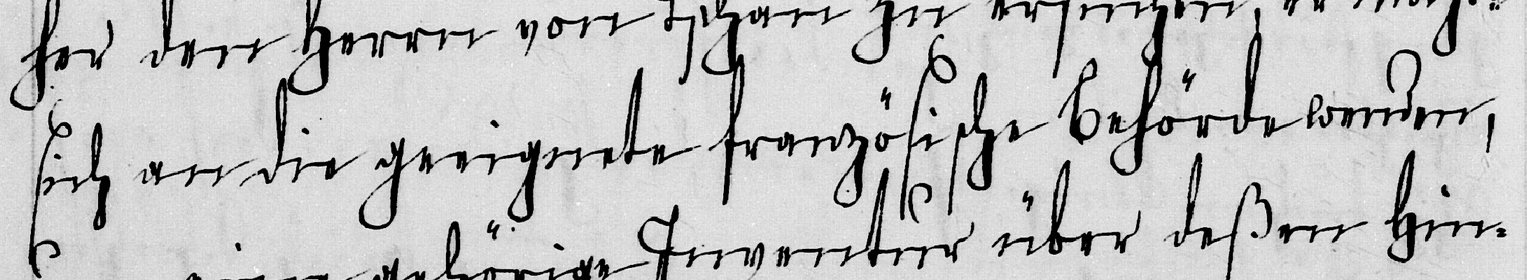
sich an die geeignete französische Behörde wenden,
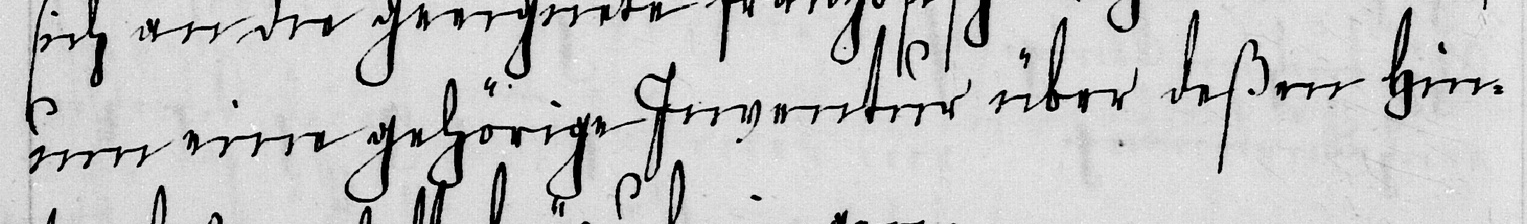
um eine gehörige Inventur über deßen Hin¬
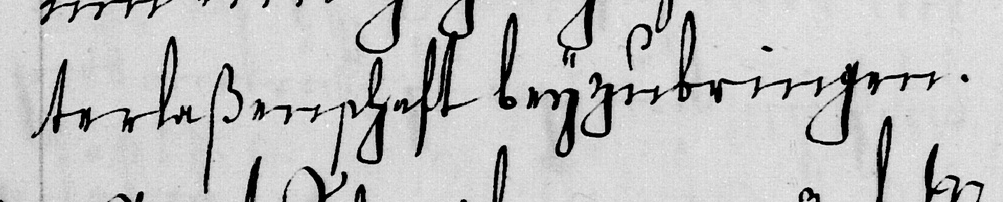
terlaßenschaft beyzubringen.
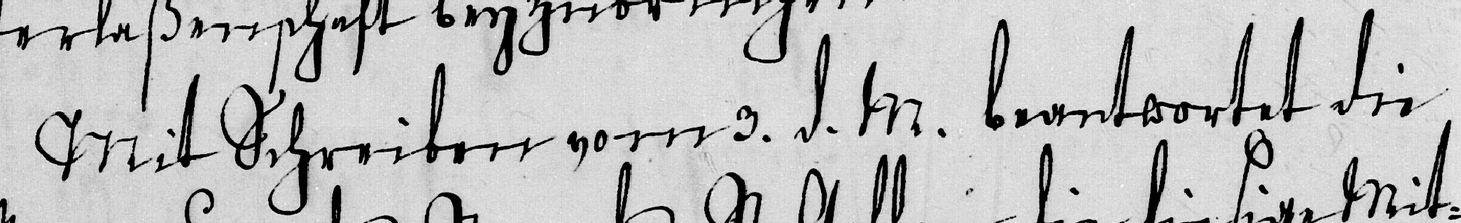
Mit Schreiben vom 3. d. M. beantwortet die
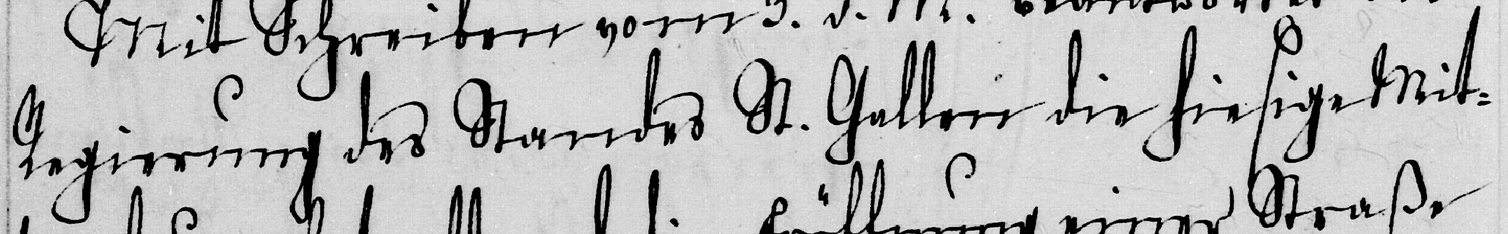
Regierung des Standes St. Gallen die hiesige Mit¬
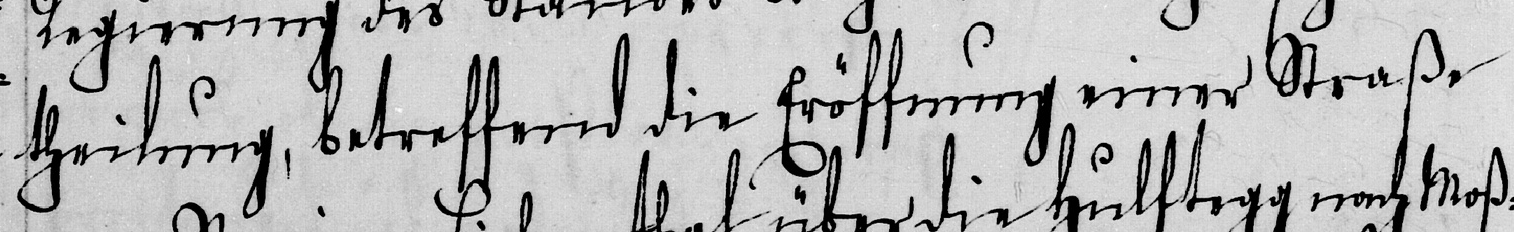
theilung, betreffend die Eröffnung einer Straße
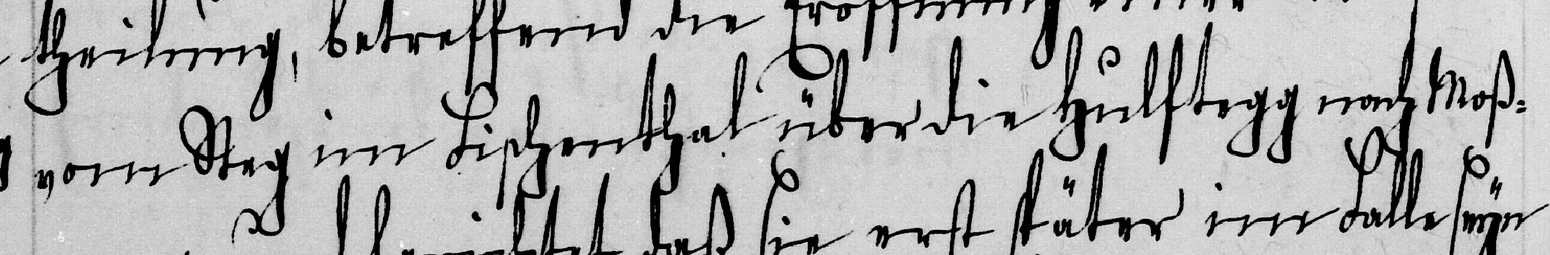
vom Steg im Fischenthal über die Hulftegg nach Moß¬
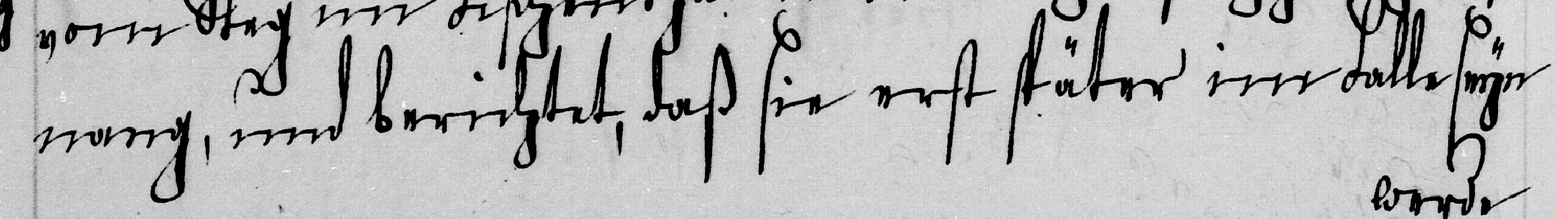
nang, und berichtet, daß sie erst später im Falle seyn
